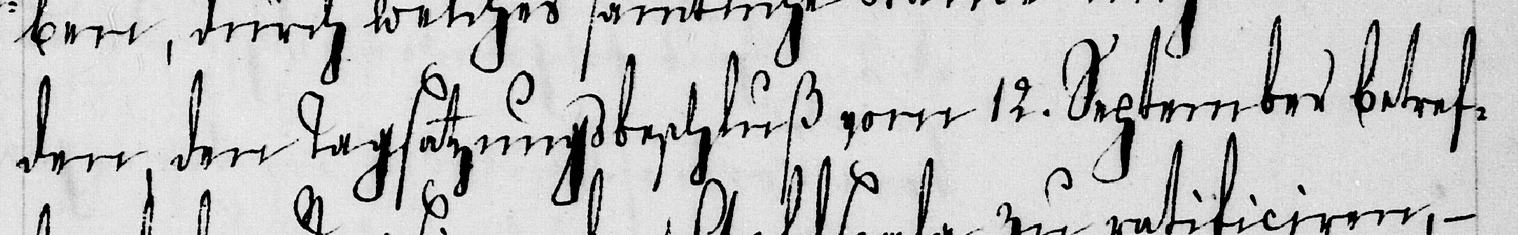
den, den Tagsatzungsbeschluß vom 12. September betref¬
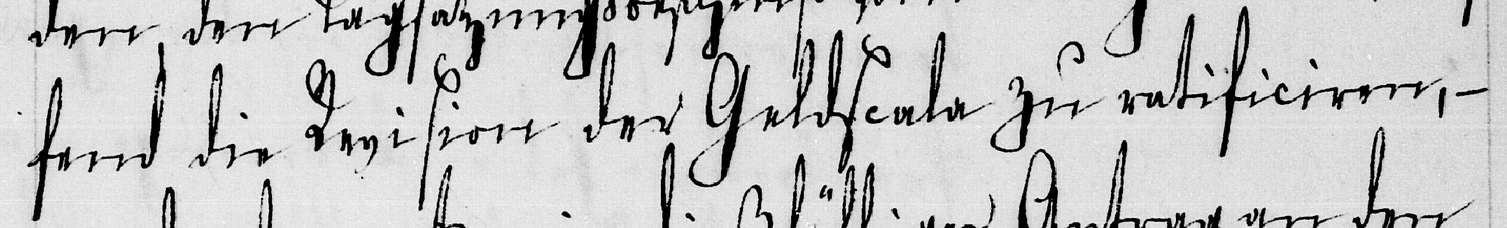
fend die Revision der Geldscala zu ratificiren, –
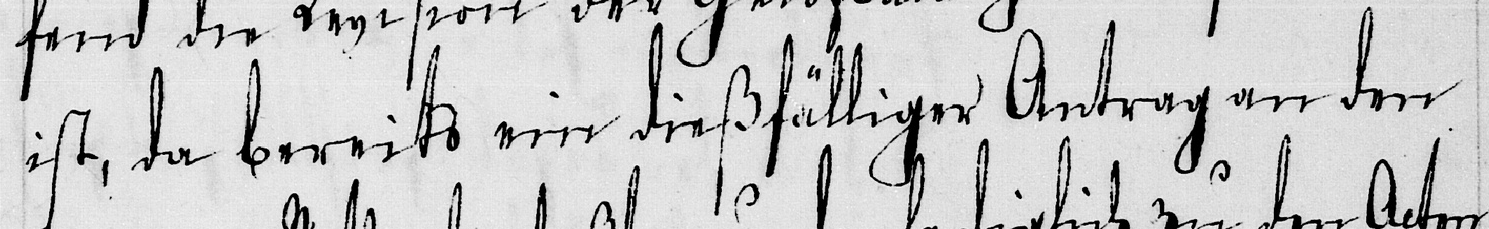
ist, da bereits ein dießfälliger Antrag an den
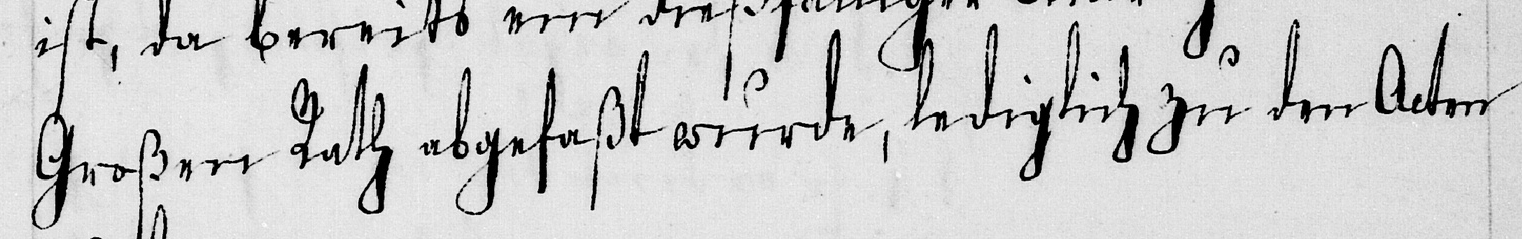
Großen Rath abgefaßt wurde, lediglich zu den Acten
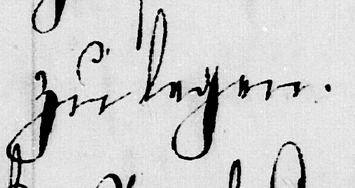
zu legen.
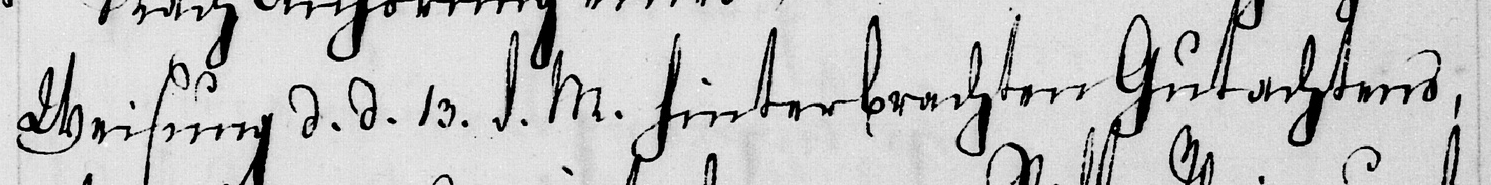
Weisung d. d. 13. d. M. hinterbrachten Gutachtens,
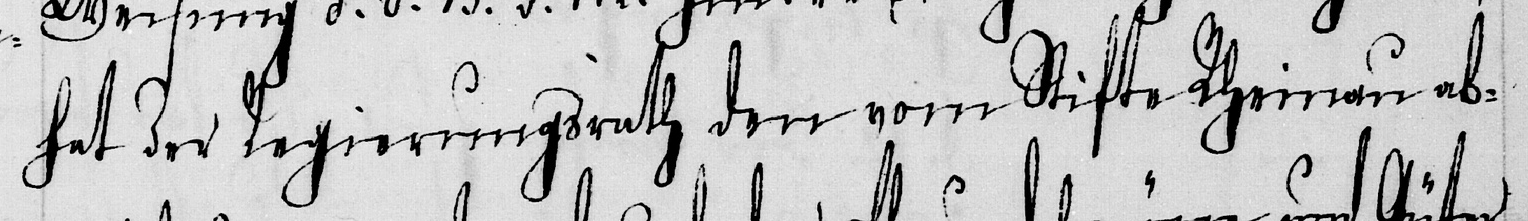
hat der Regierungsrath den vom Stifte Rheinau ab¬
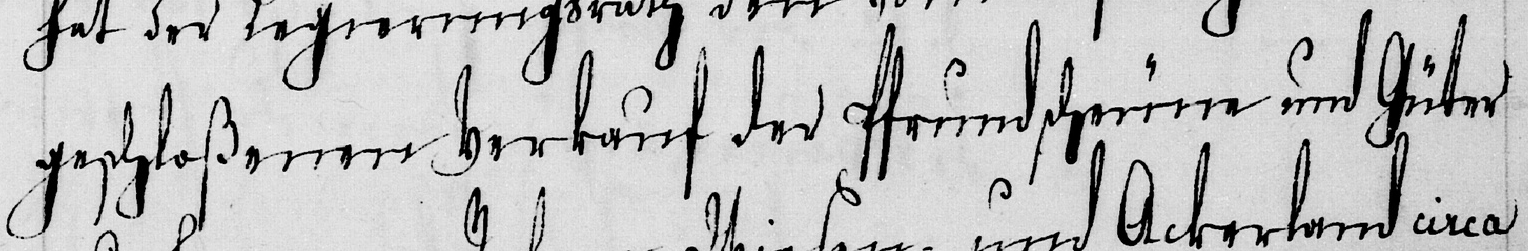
geschloßenen Verkauf der Pfrundscheune und Güter
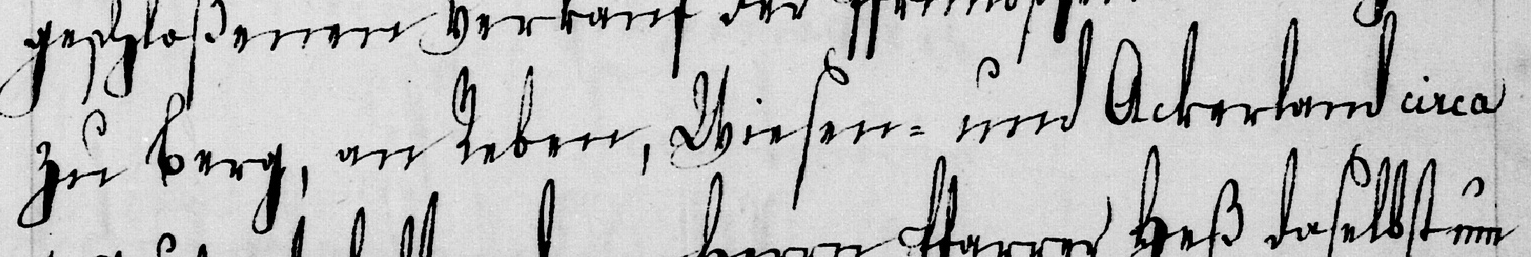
zu Berg, an Reben, Wiesen- und Ackerland circa
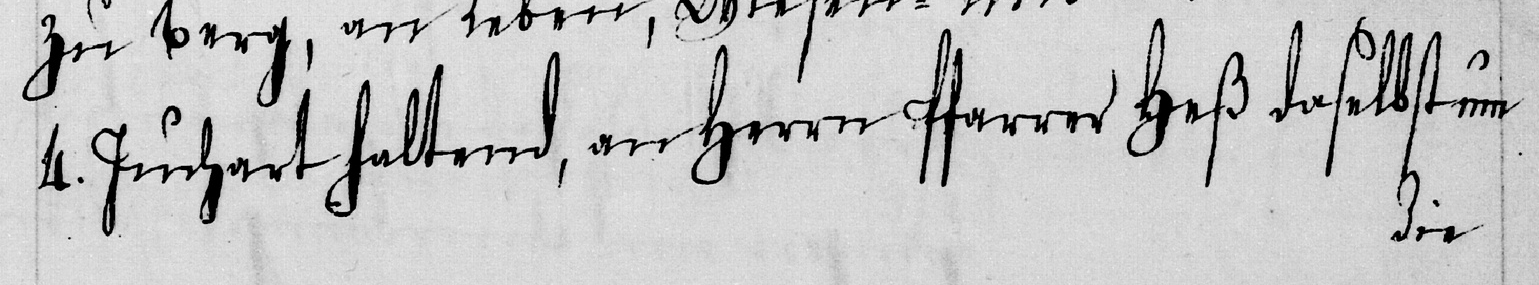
4. Juchart haltend, an Herrn Pfarrer Heß daselbst um
